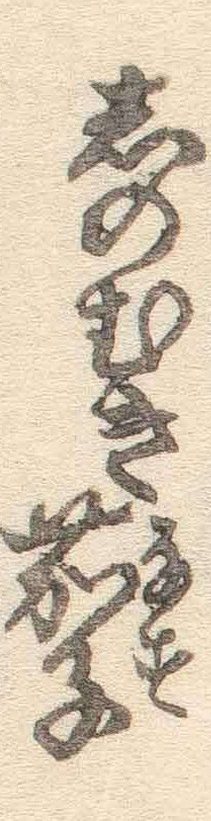しのむき柚子
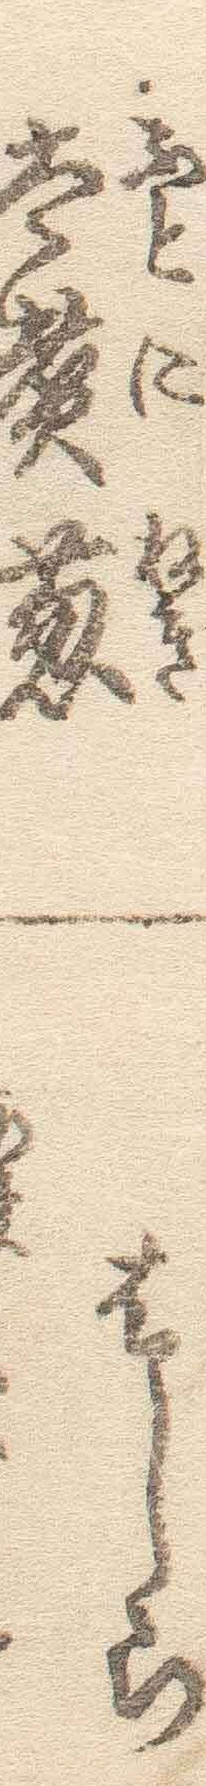太煮葱はしら
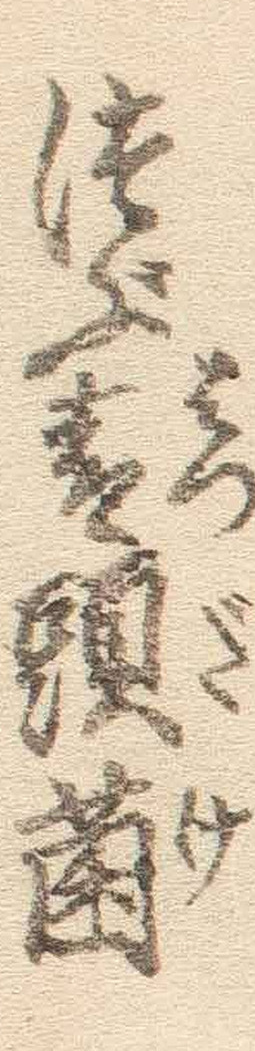つぶ青頭菌
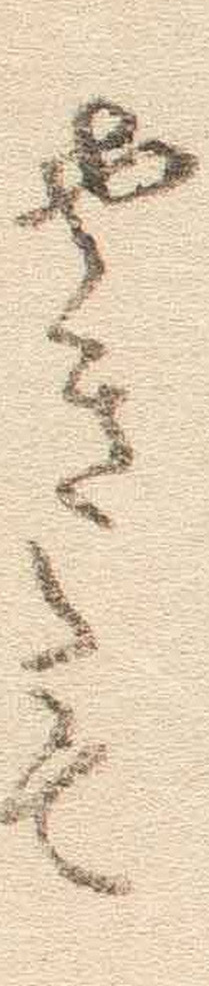やきたて

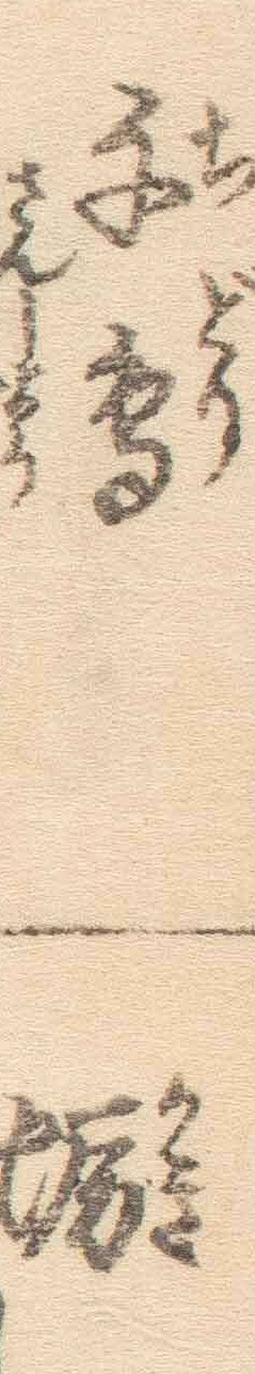千鳥蛎
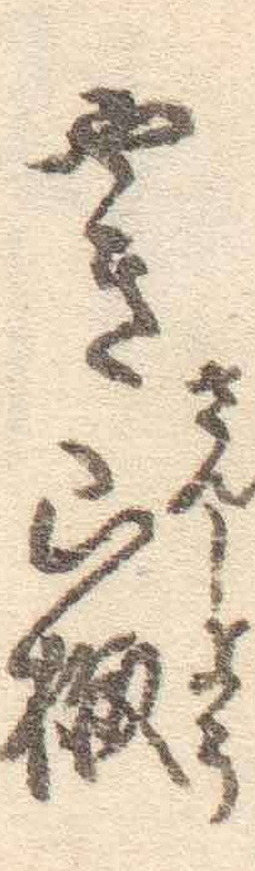やき山椒
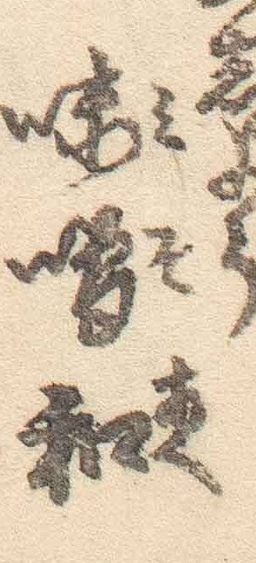味噌煮
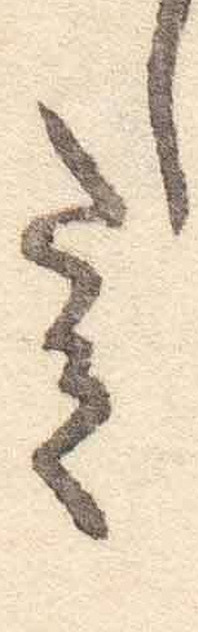したぢ
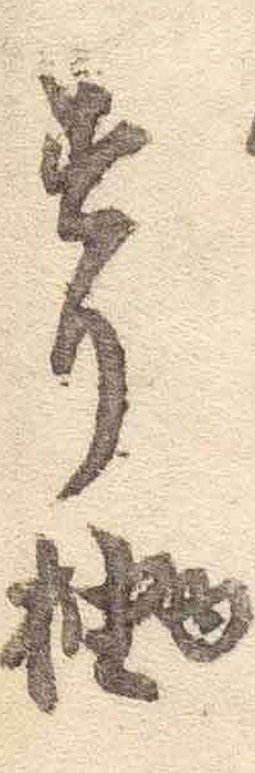すり柚
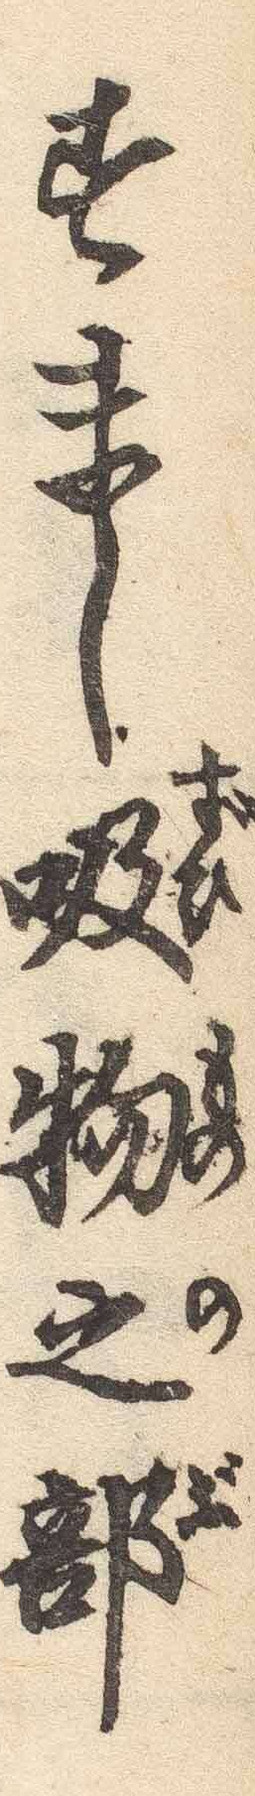すまし吸物之部
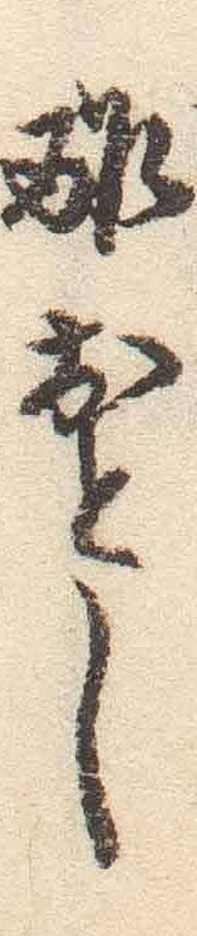酢おとし
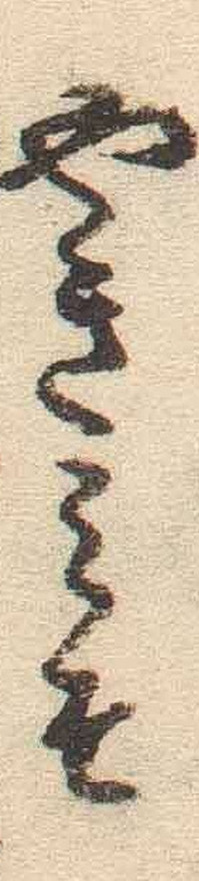やきみそ
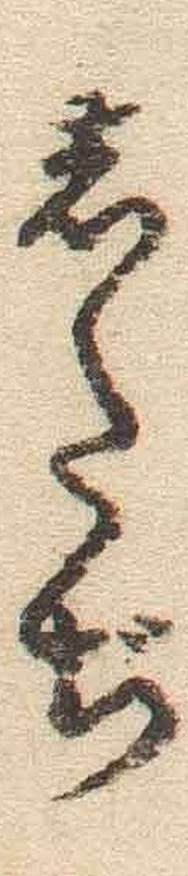したぢ

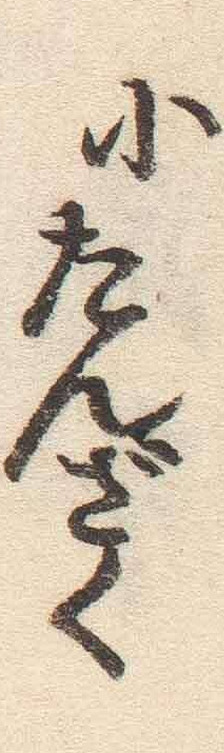たんざく糸
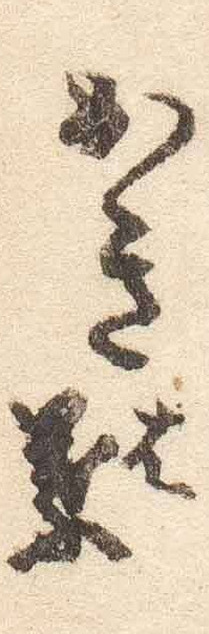かき柑
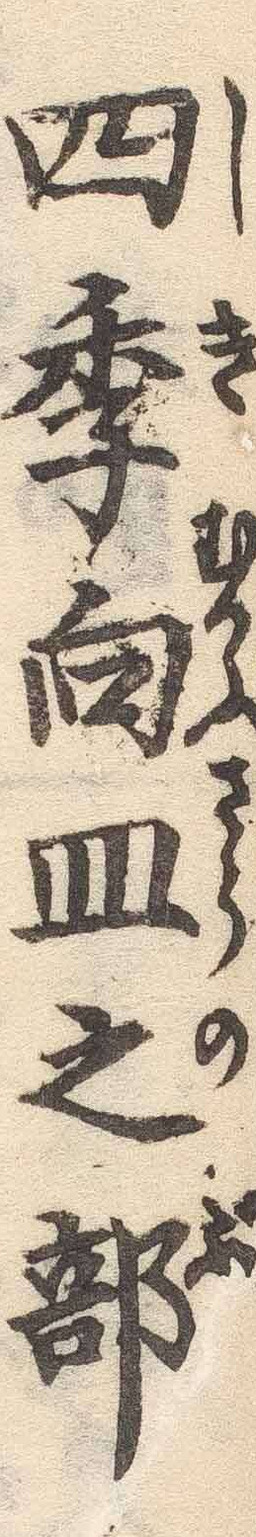四季向皿之部
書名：料理通
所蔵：東京学芸大学附属図書館 国文学研究資料館
